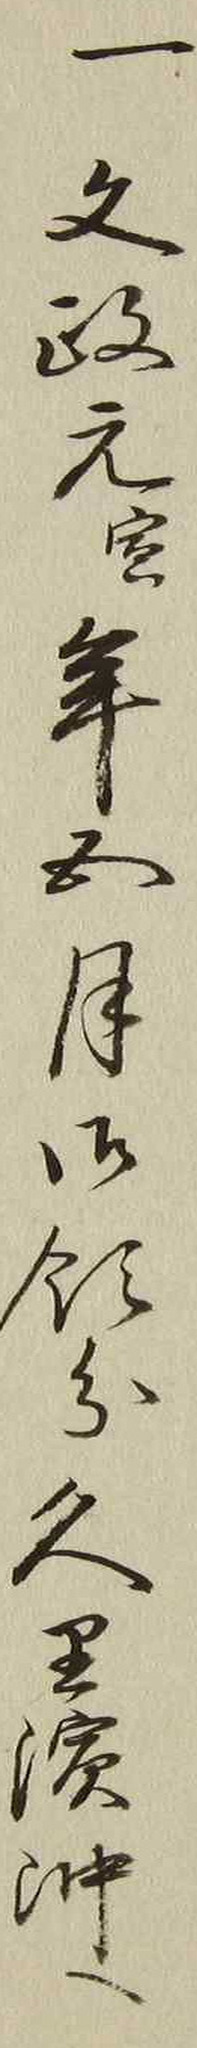一文政元寅年五月御領分久里浜沖へ
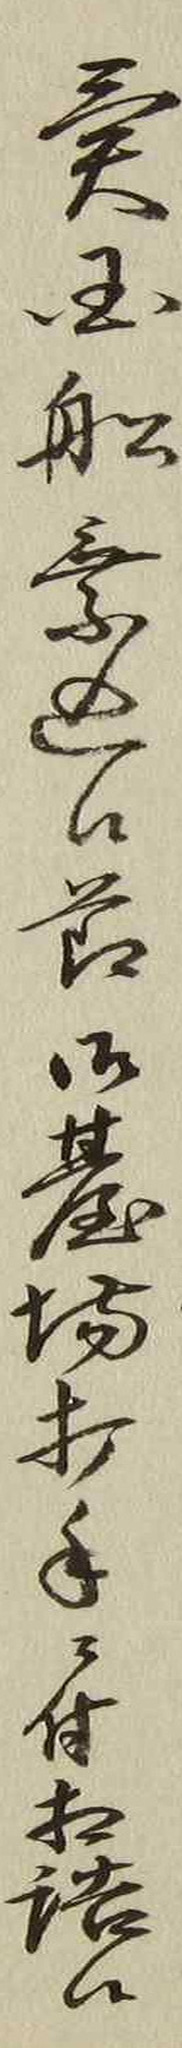異国舩乗込候節御台場打手ニ付相詰候
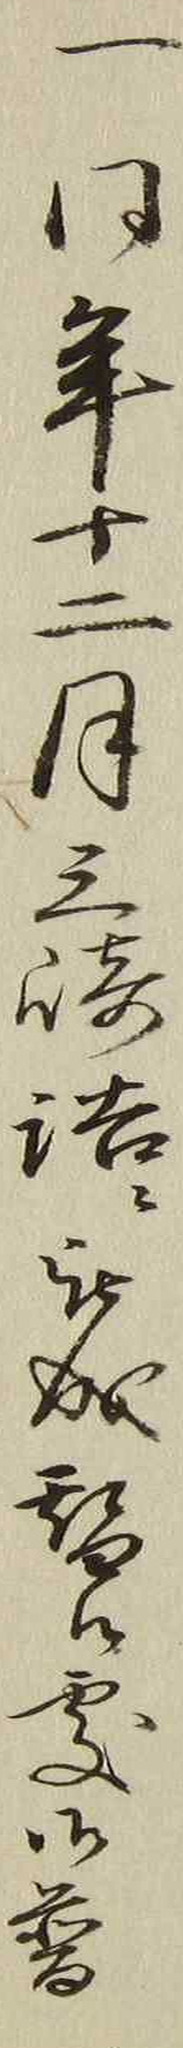一同年十二月三崎詰ニ被成替候處御普
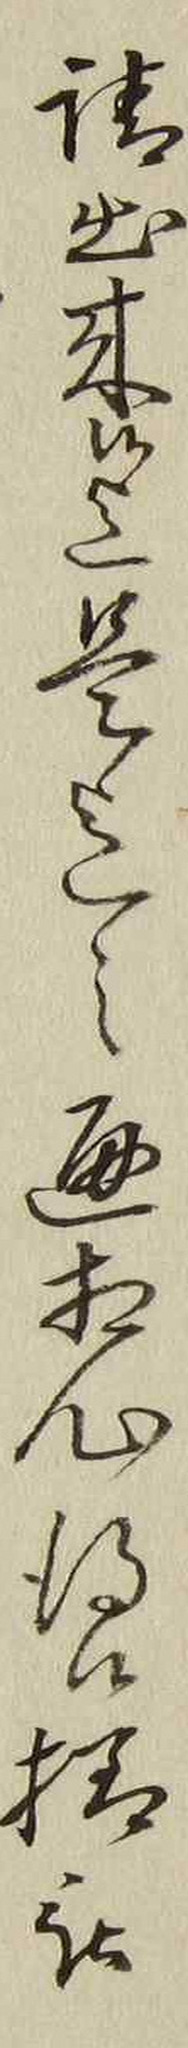請出来候迄是迄之通相心得候様被
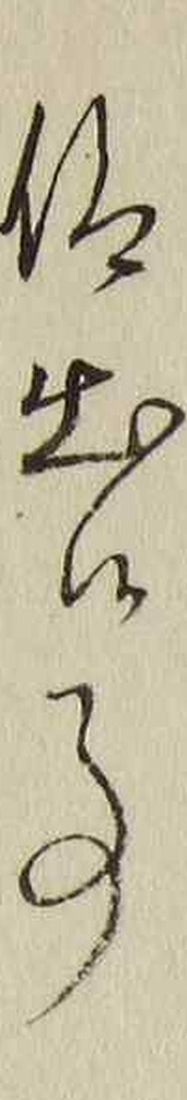仰出候事
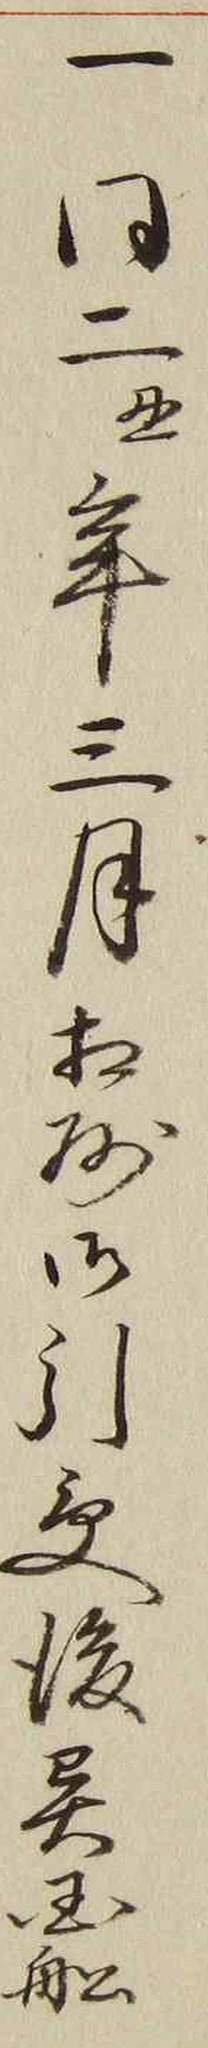一同ニ丑年三月相州御引受後異国舩
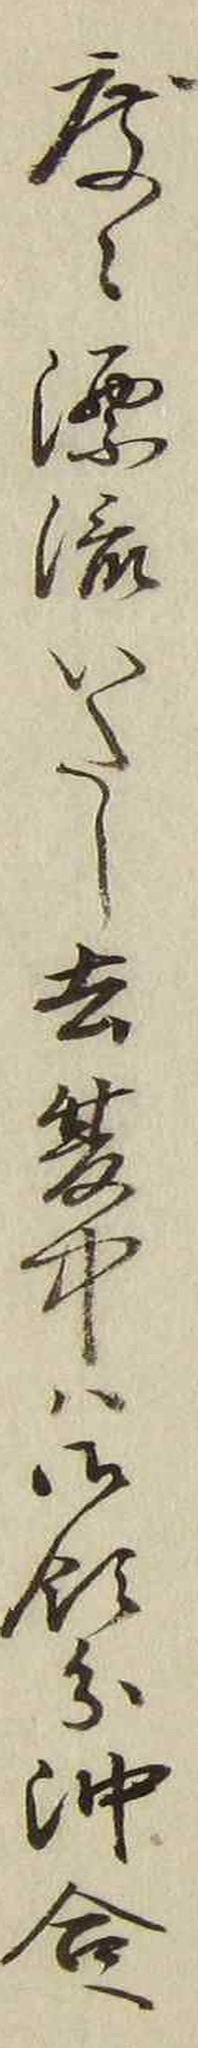度々漂流いたし去夏中ハ御領分沖合へ

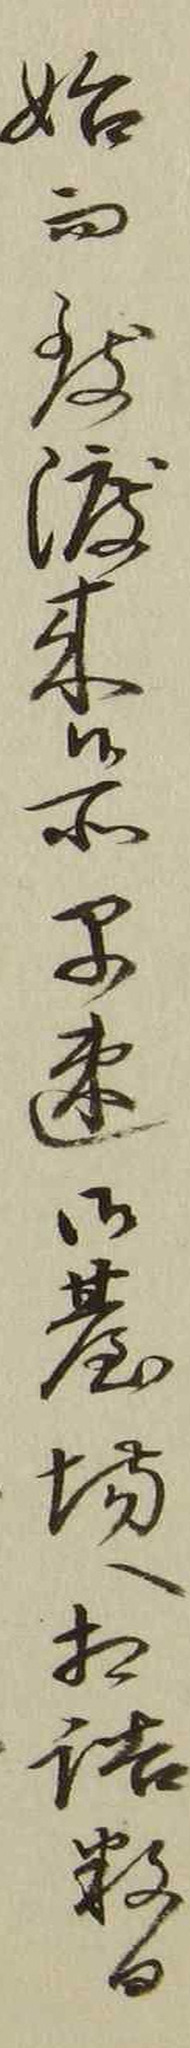始而致渡来候所早速御台場へ相詰数日
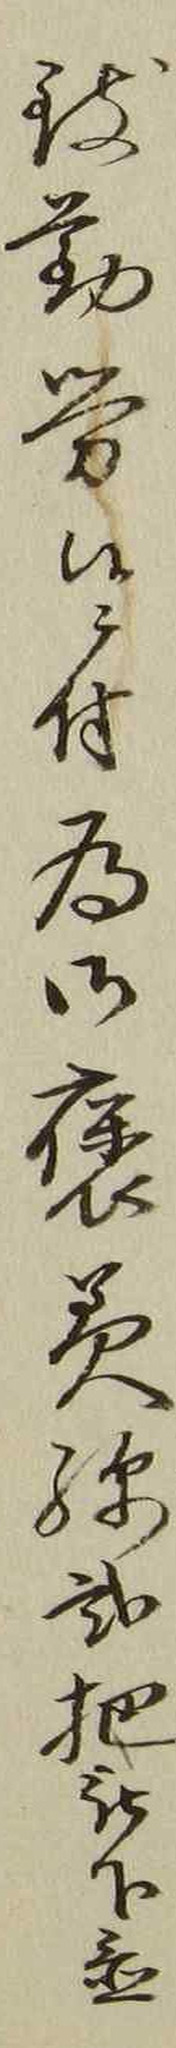致勤労候ニ付為御褒美綿弐把被下置
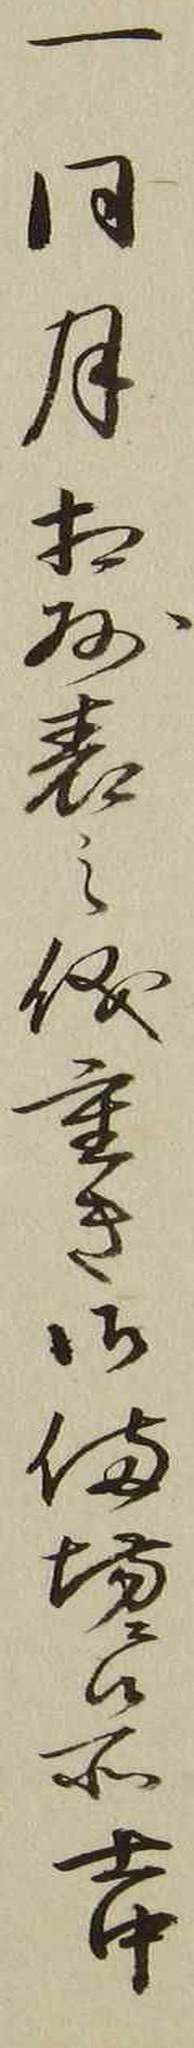一同月相州表之儀重き御備場ニ候所士中
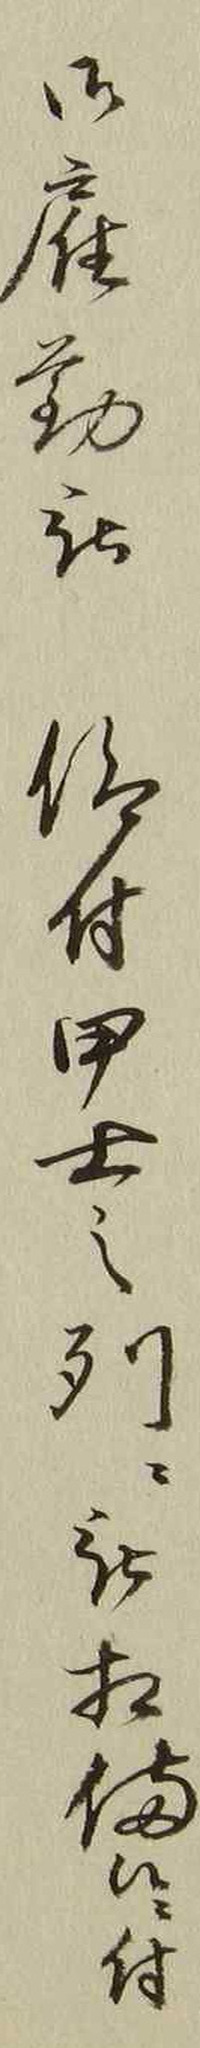御雇勤被仰付甲士之列ニ被相備候ニ付
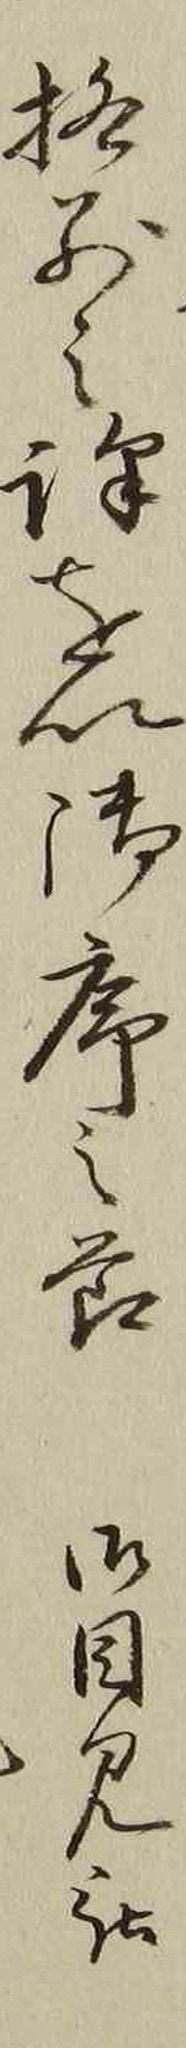格別之訳を以御序ノ雪御目見被
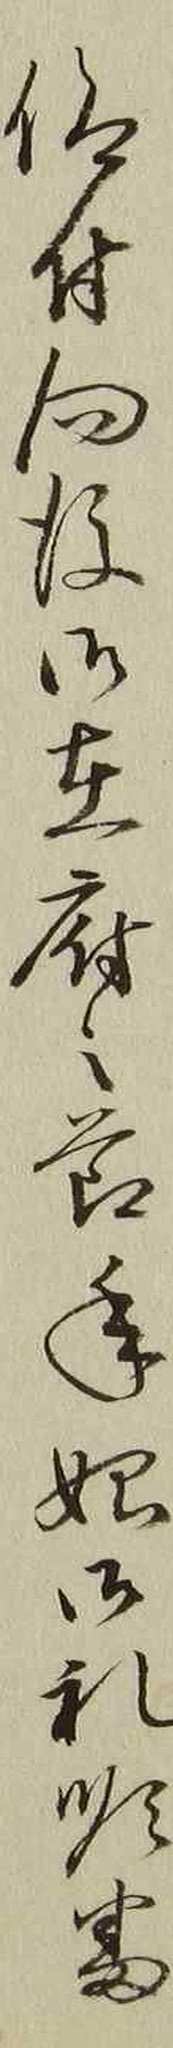仰付向後御在府之節手始御礼順番
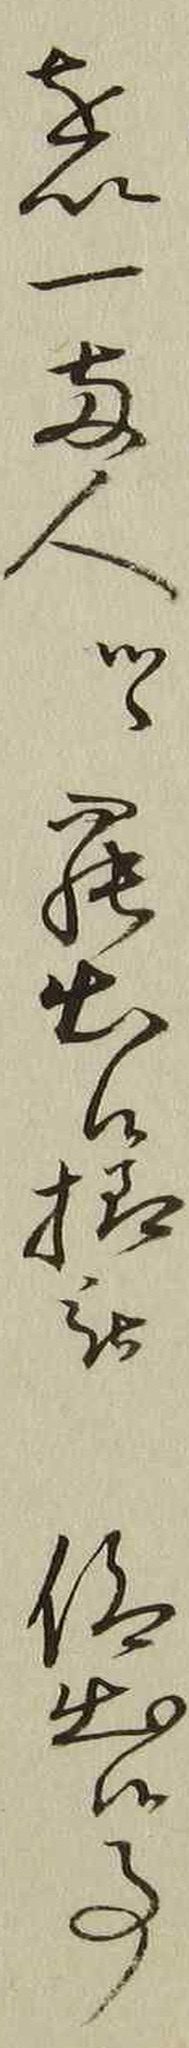を以一両人ツヽ罷出候様被仰出候事
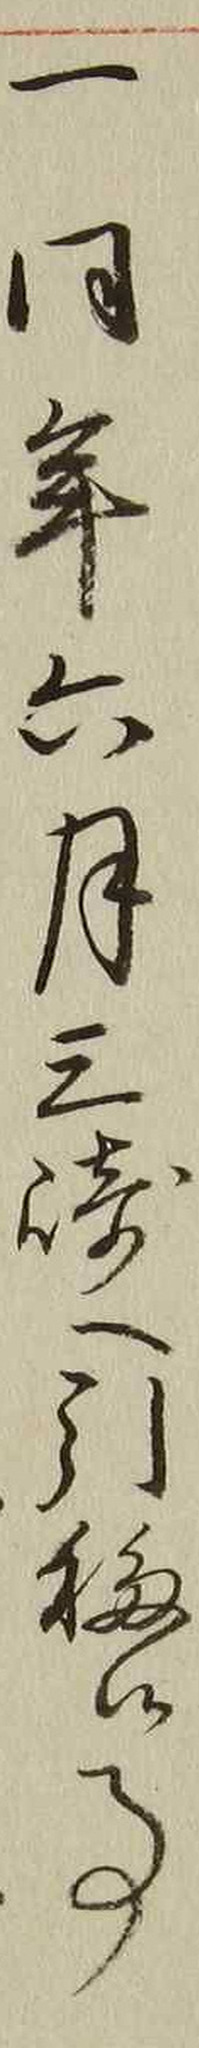一同年六月三崎へ引移候事
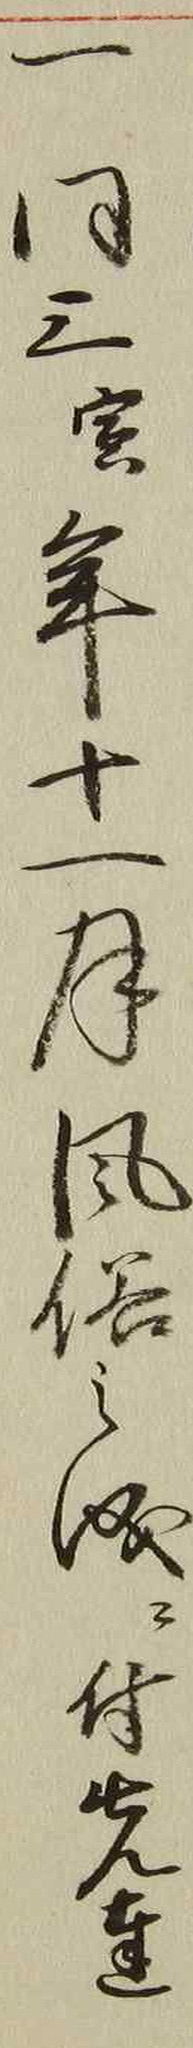一同三寅年十一月風俗之儀ニ付先達
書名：諸士系譜　巻之114　か之部22
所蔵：会津若松市立会津図書館
